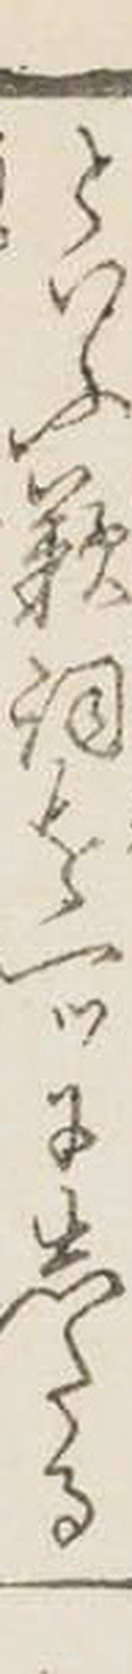といふ嘆詞を一ッにしたる
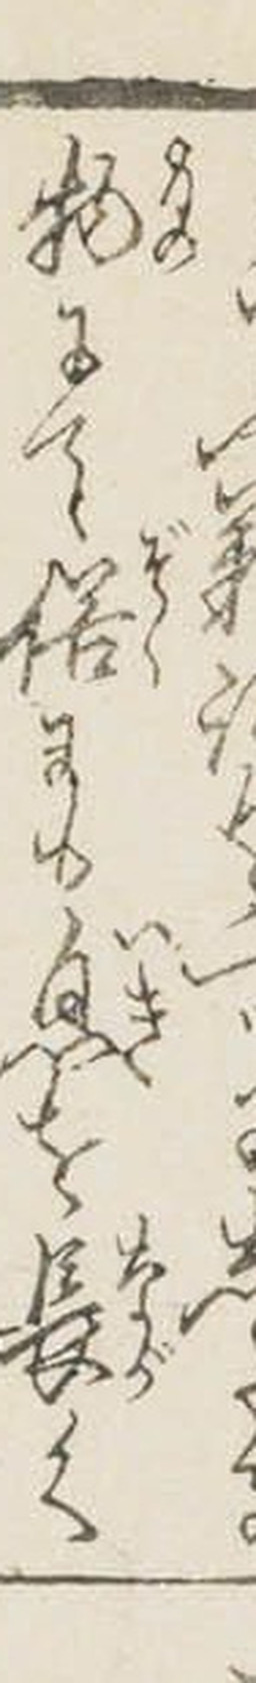物にて俗にも息を長く
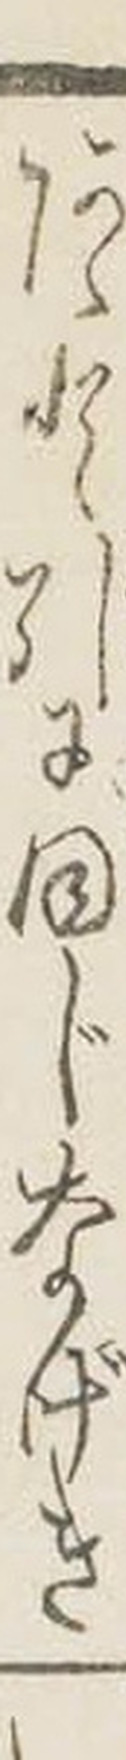あゝと引に同じなげき
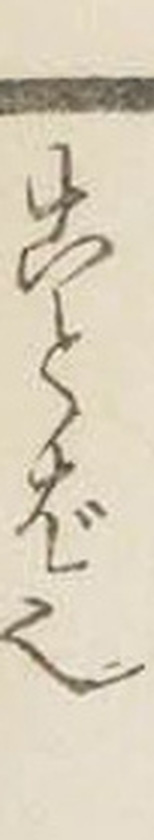ことば也
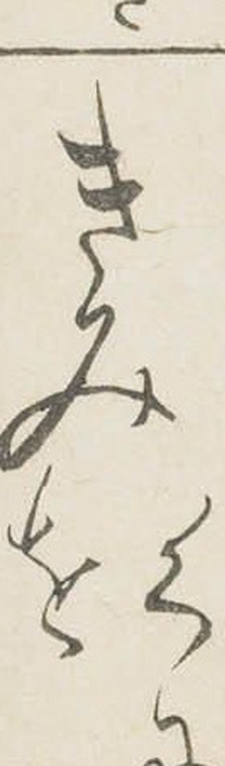きみを
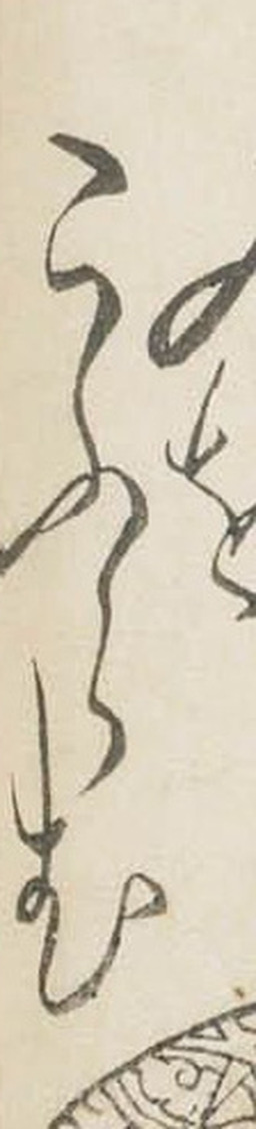こふらむ
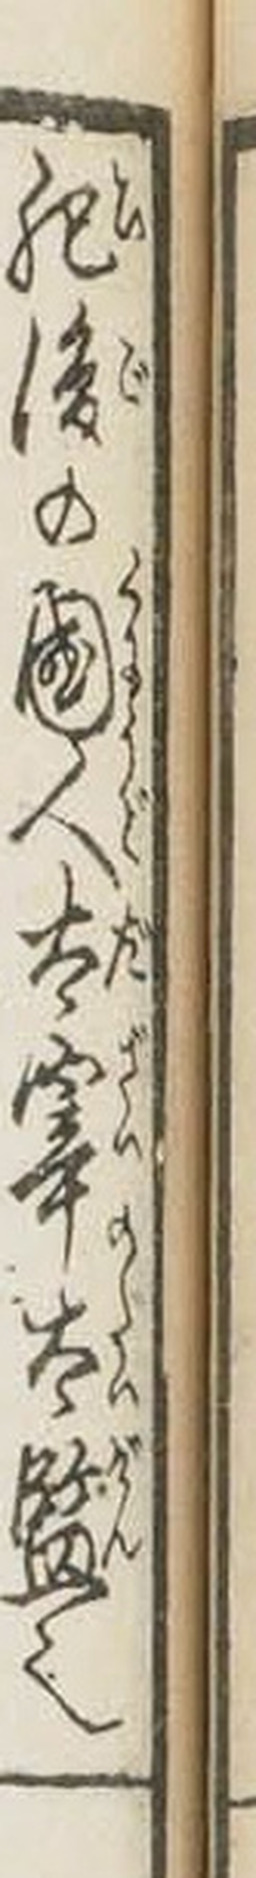肥後の国人太宰太監也
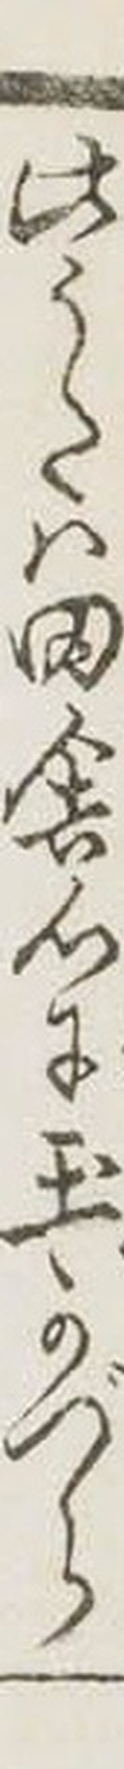此うたは田舎心に玉かづら
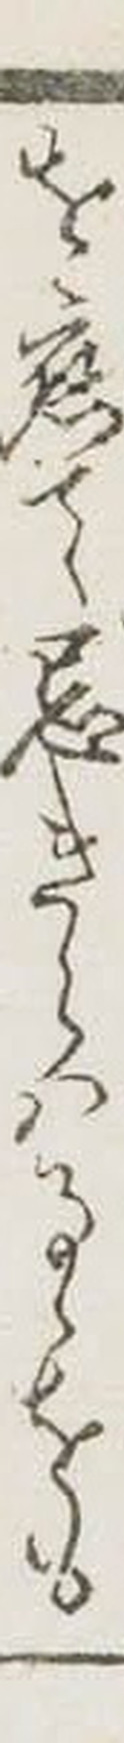を恋て忌きらはるゝをも
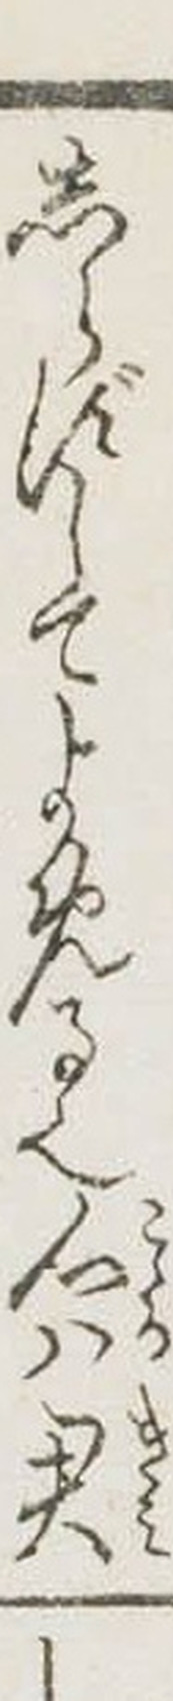しらずしてよめる也心は君
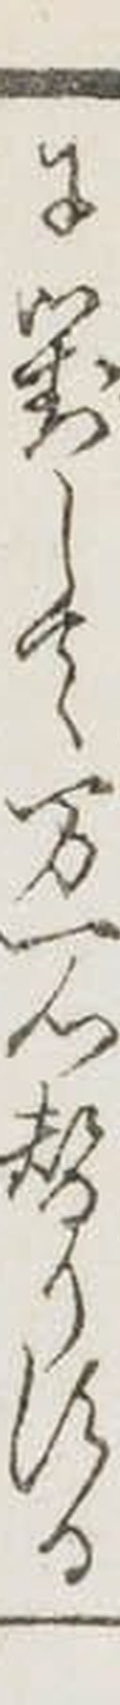に対して万一心替りする
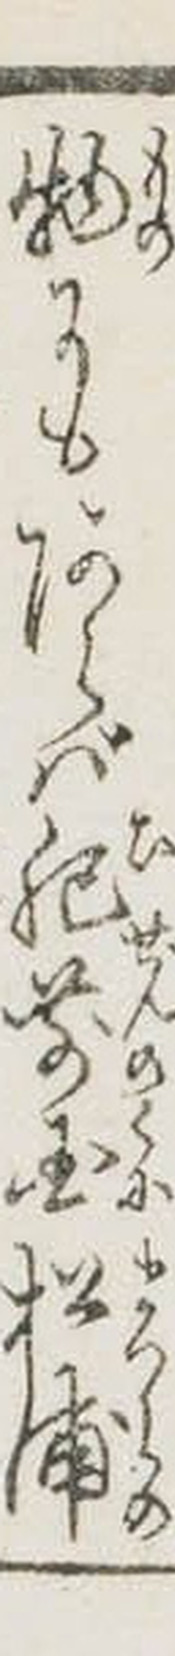物にもあらば肥前国松浦
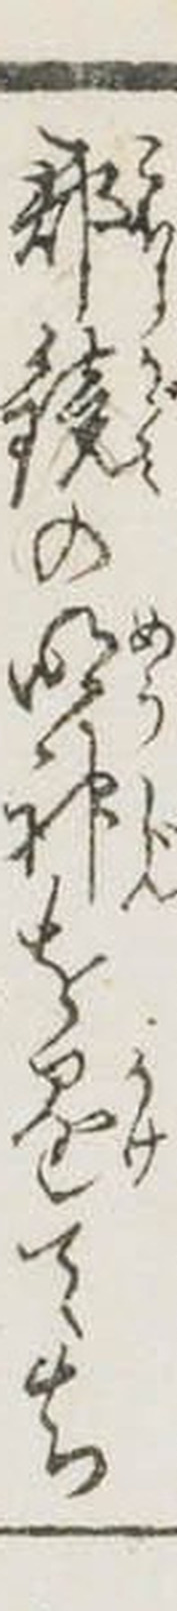郡鏡の明神を懸てち
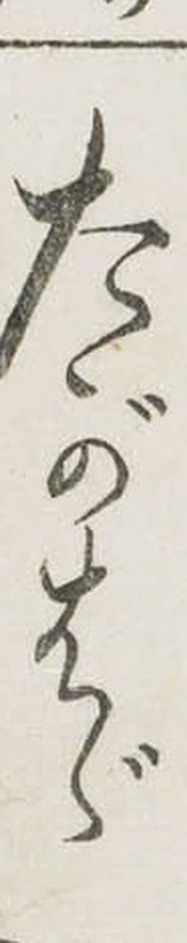たがはゞ
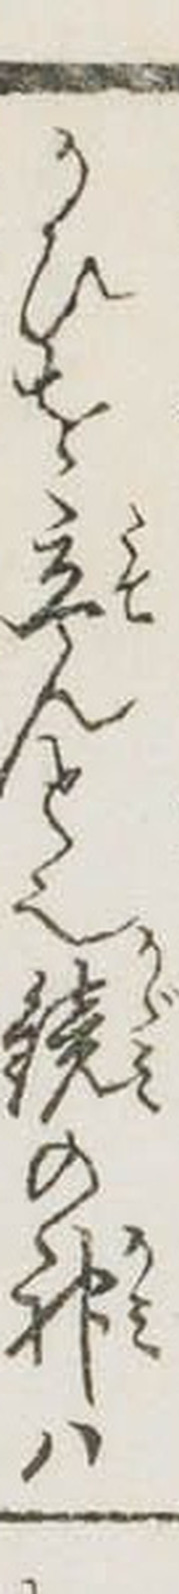かひを立んと也鏡の神は
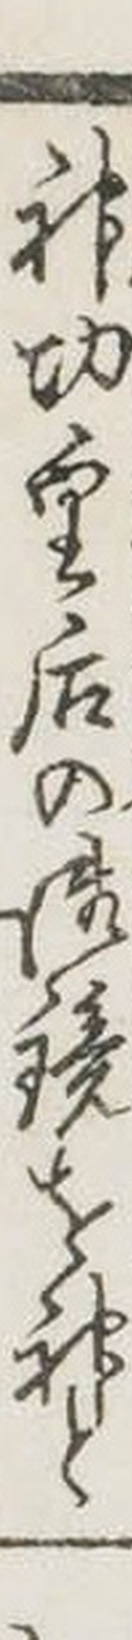神功皇后の御鏡を神と
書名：源氏百人一首
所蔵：東京学芸大学教育コンテンツアーカイブ
